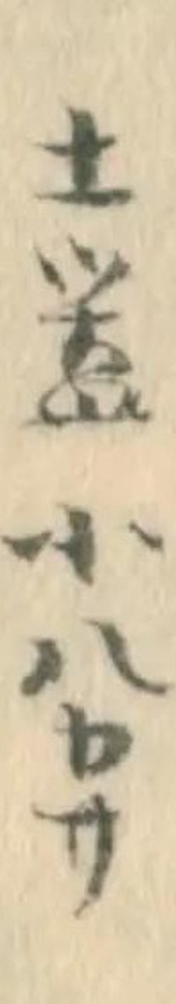土器小ハカサ
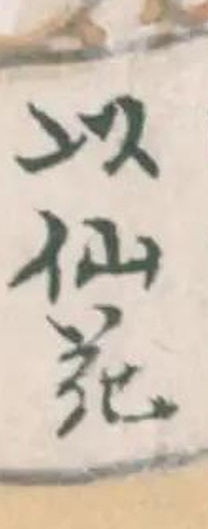以仙花
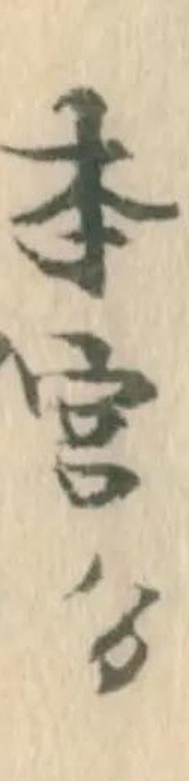本宮分
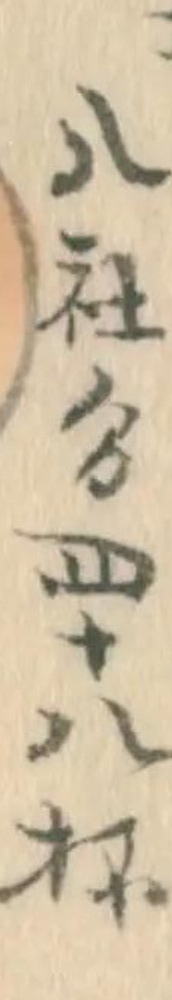八社分四十八杯
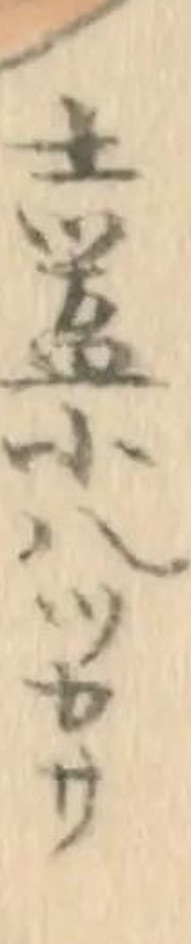土器小ハツカサ
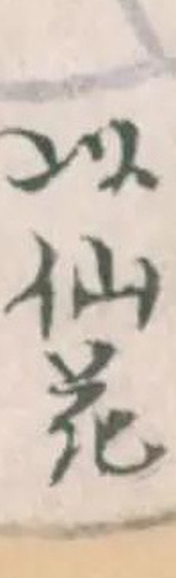以仙花
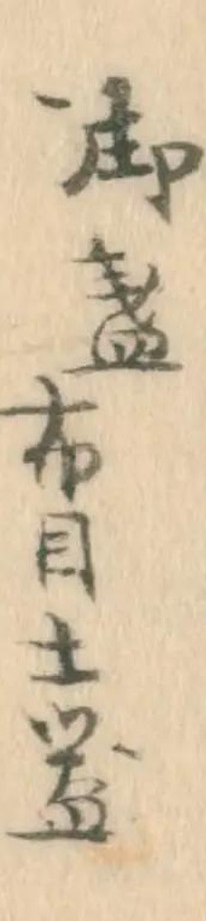御盞布目土器
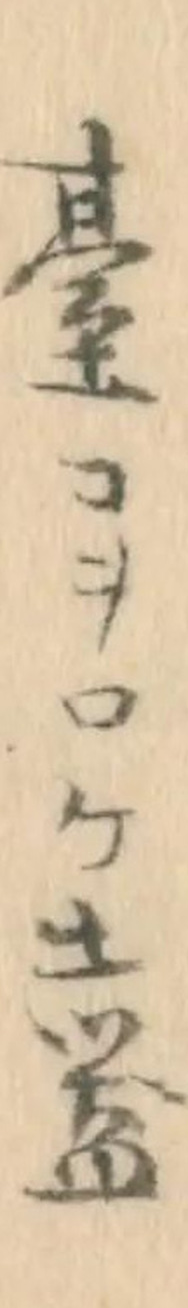台コヲロケ土器
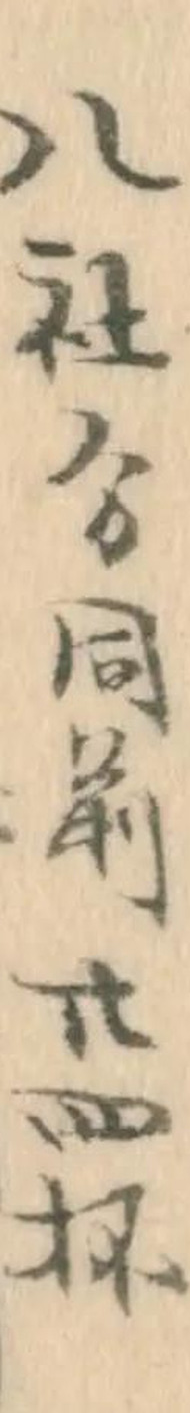八社分同前廿四杯
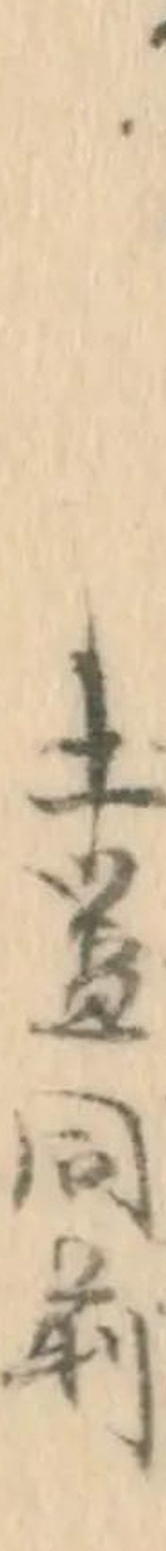土器同前
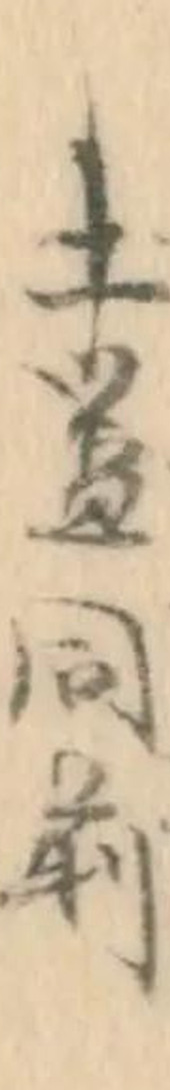土器同前
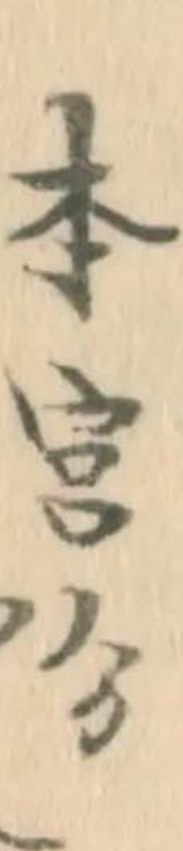本宮分
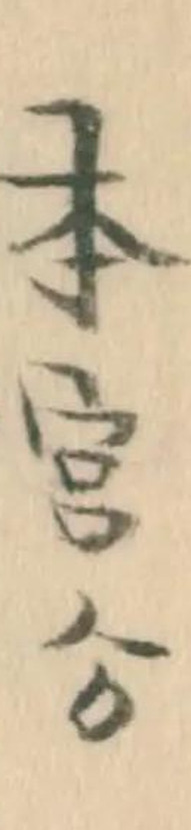本宮分
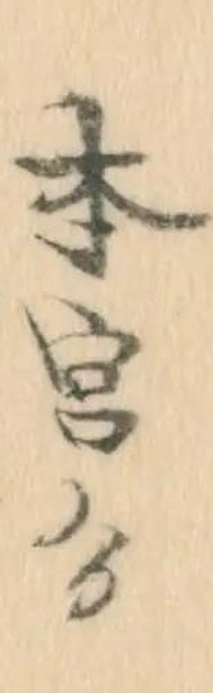本宮分
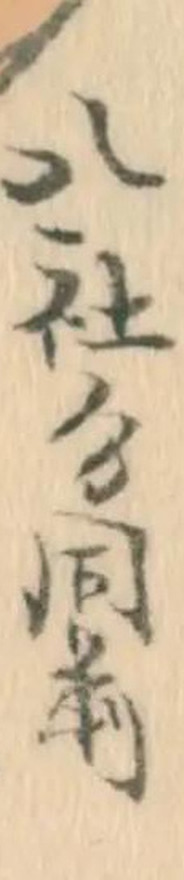八社分同前
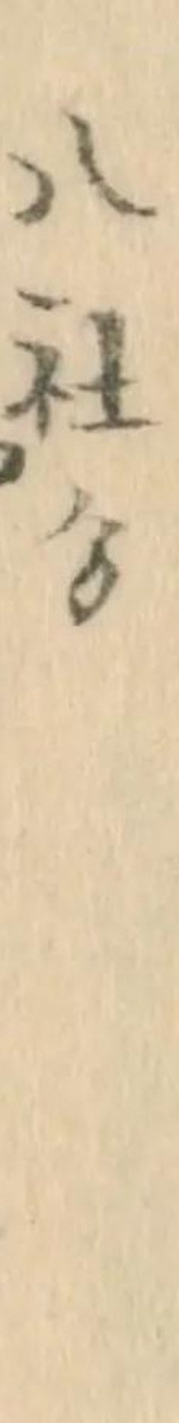八社分
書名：葵御祭供進之神饌諸品色目書
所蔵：国立国会図書館 National Diet Library, JAPAN
